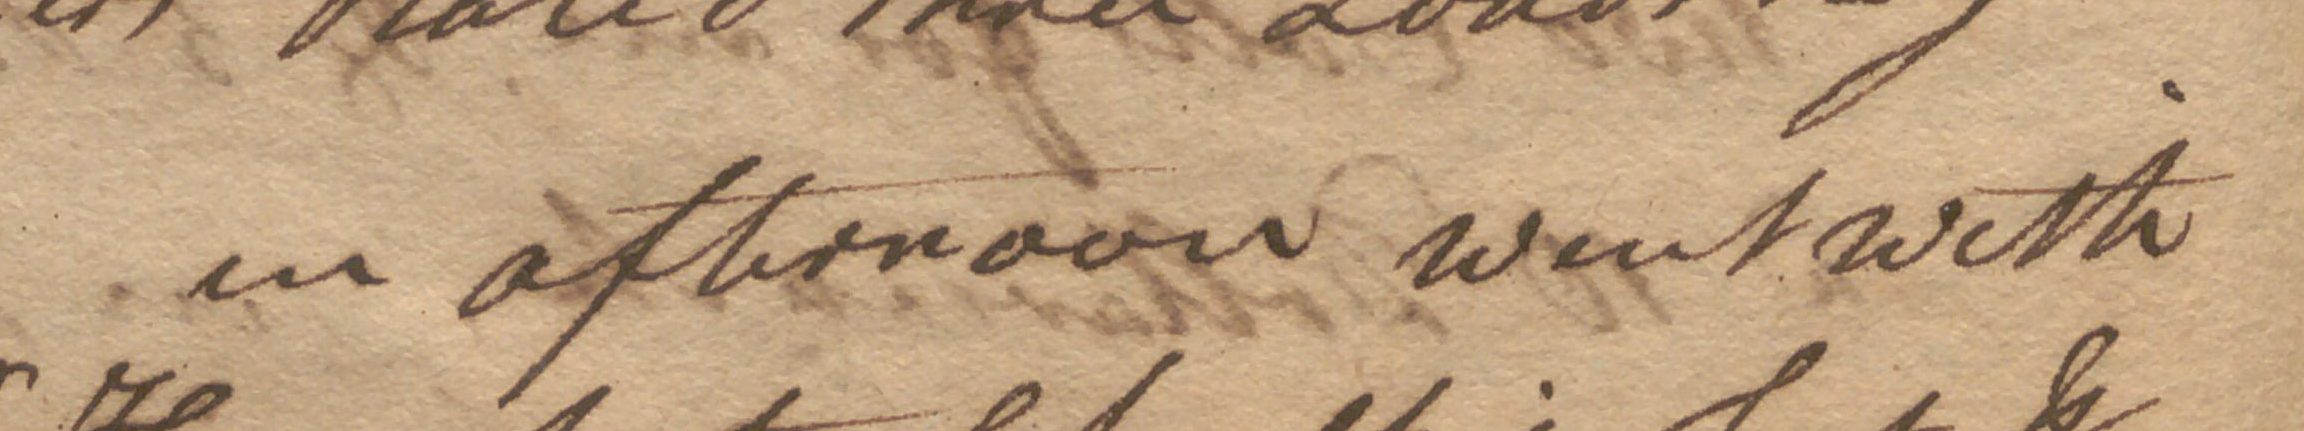in afternoon weut with
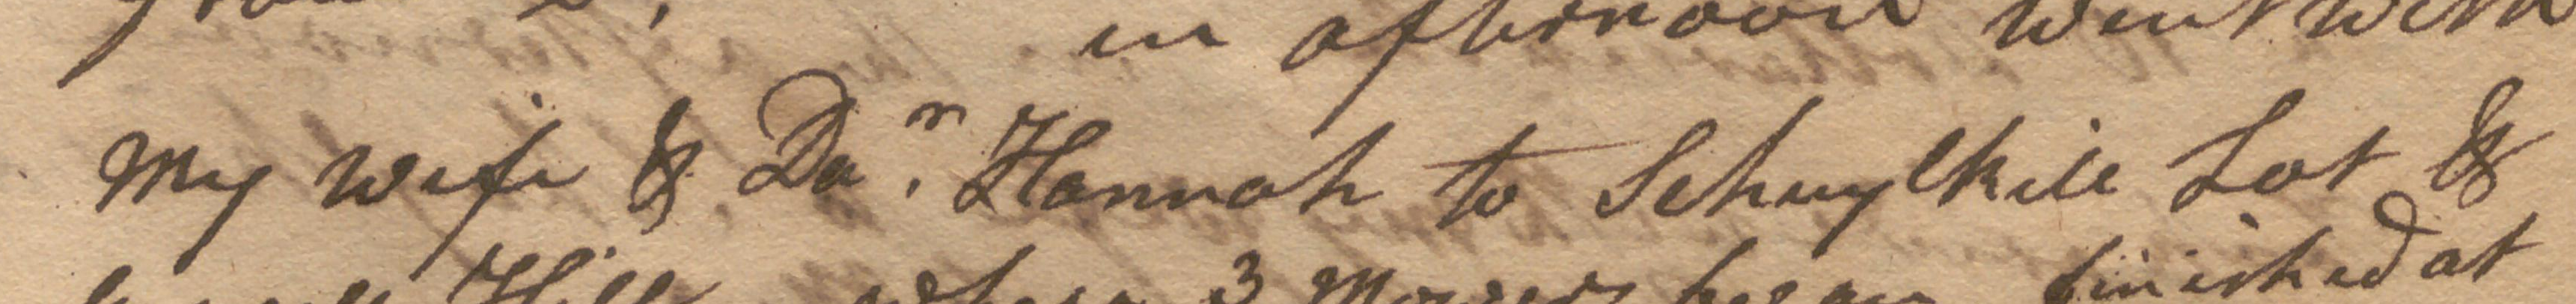my wife & Da^r. Hannah to Schuylkill Lot &
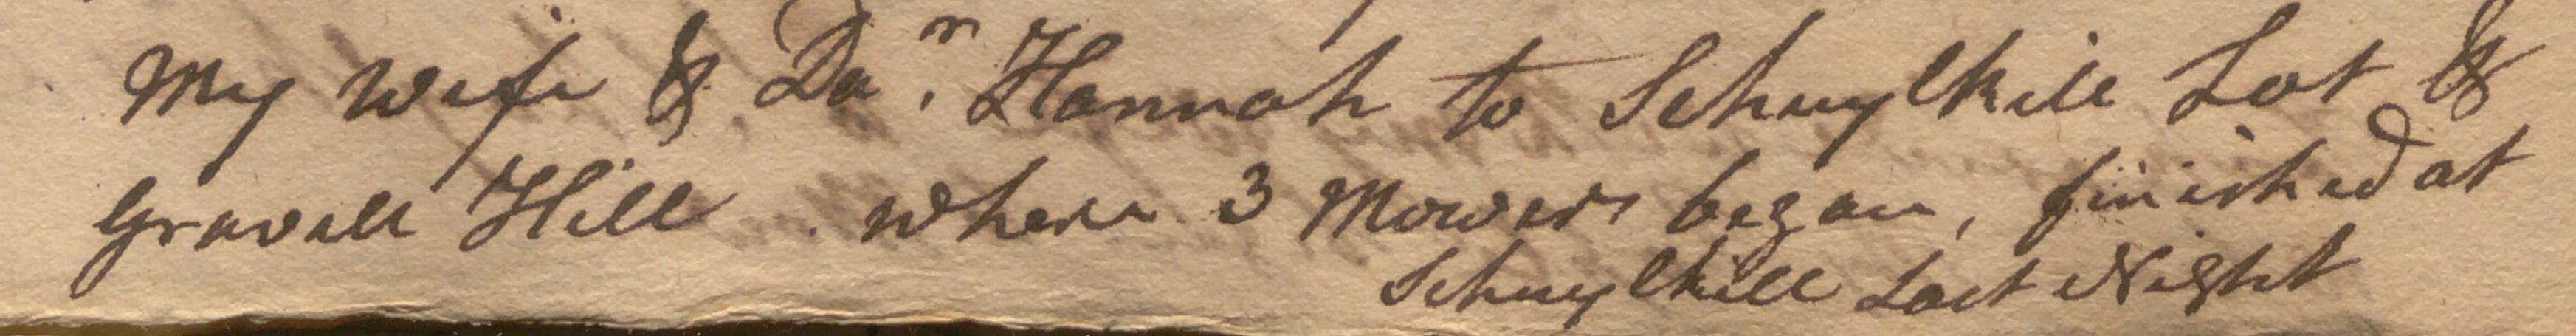Gravell Hill where 3 Mowers began, finished at
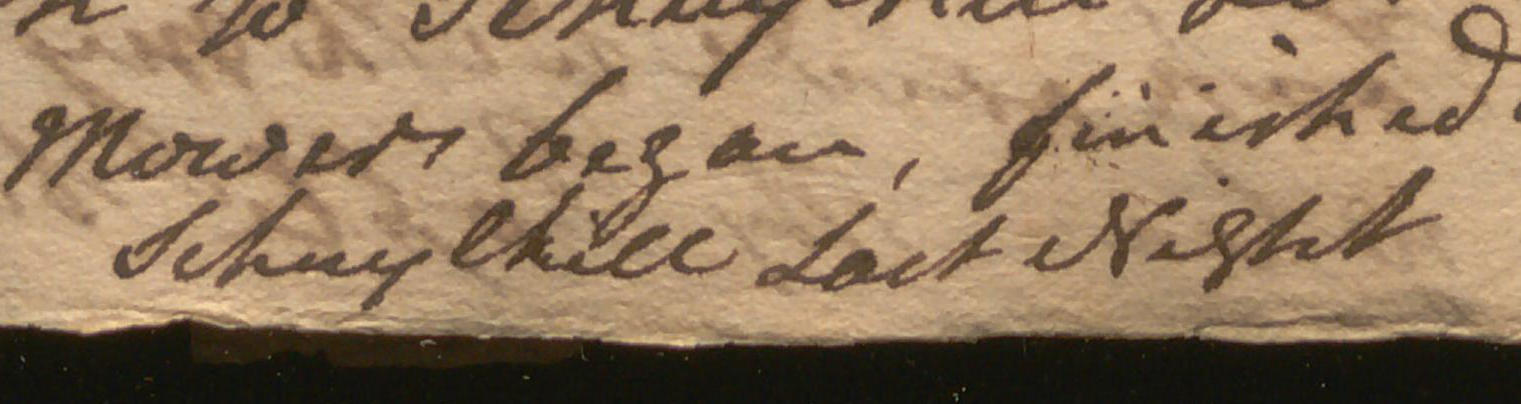Schuylkill Last Night
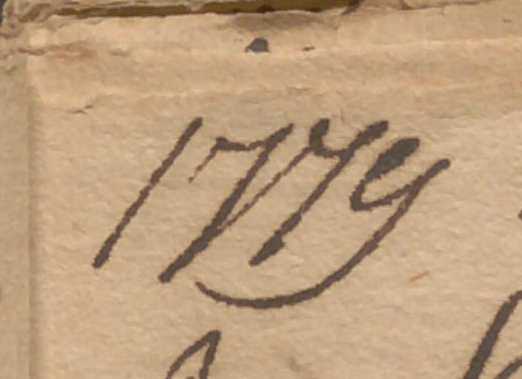1779
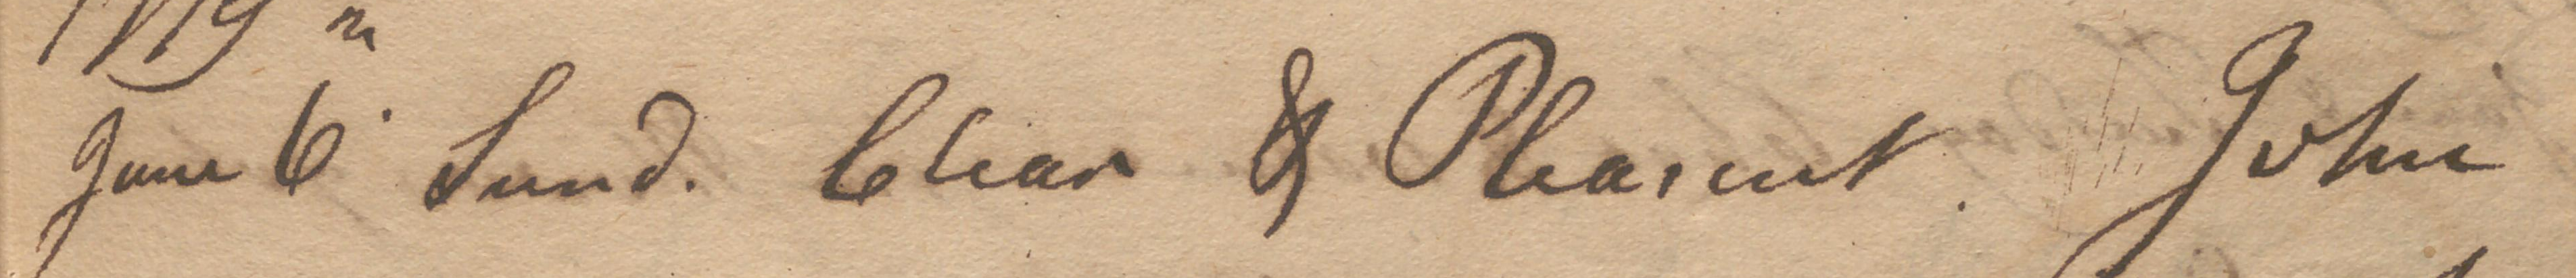June 6^th. Sund. Clear & Pleasent John
